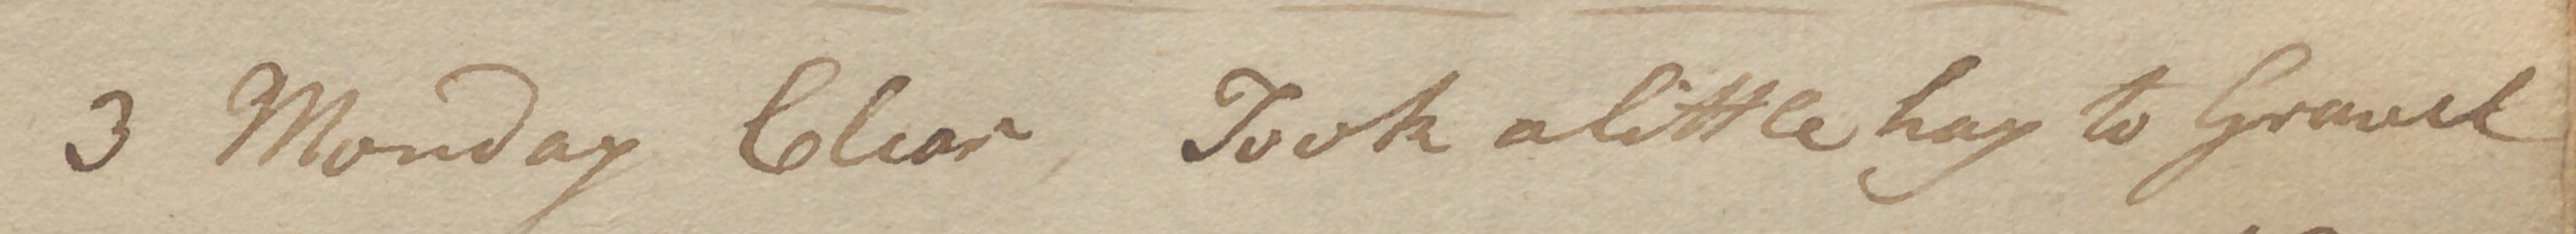3 Monday Clear, Took a little hay to Gravel
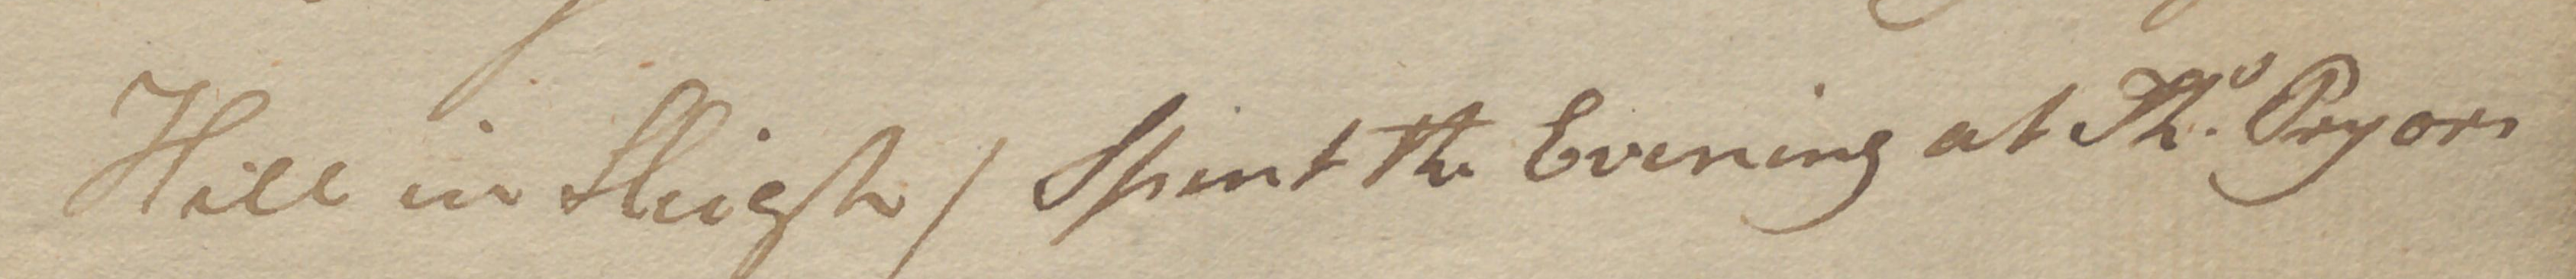Hill in Sleigh / spent the Evening at Th^s. Pryors
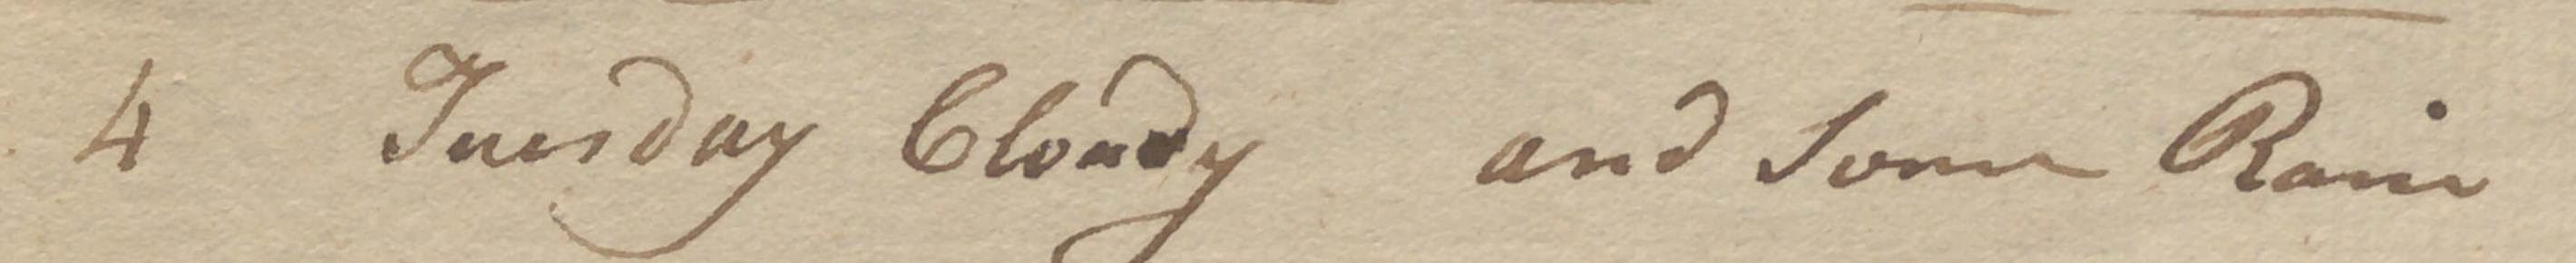4 Tuesday Cloudy and some Rain
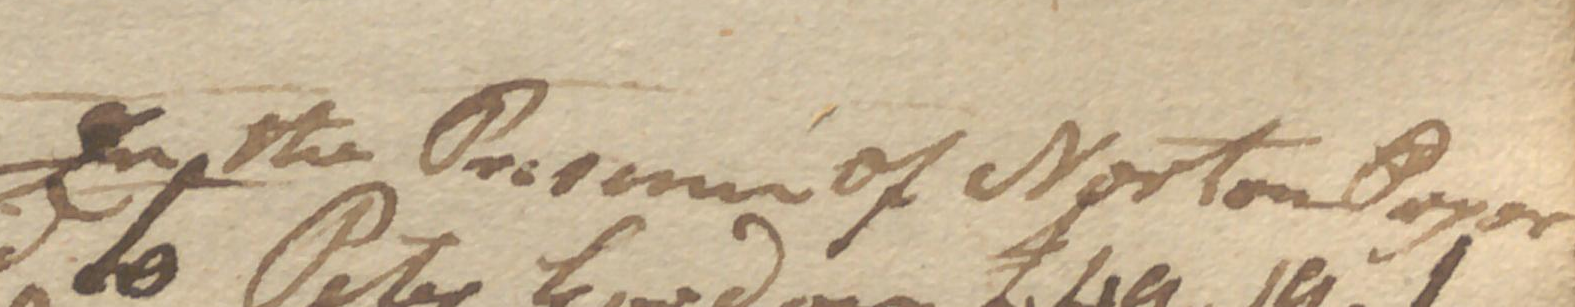In the Presence of Norton Pryor
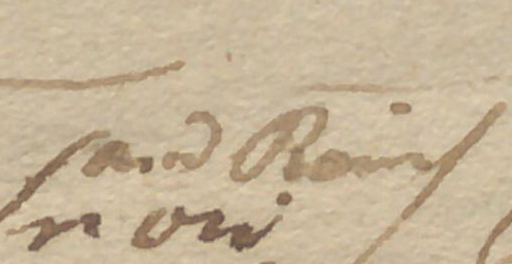and Rain
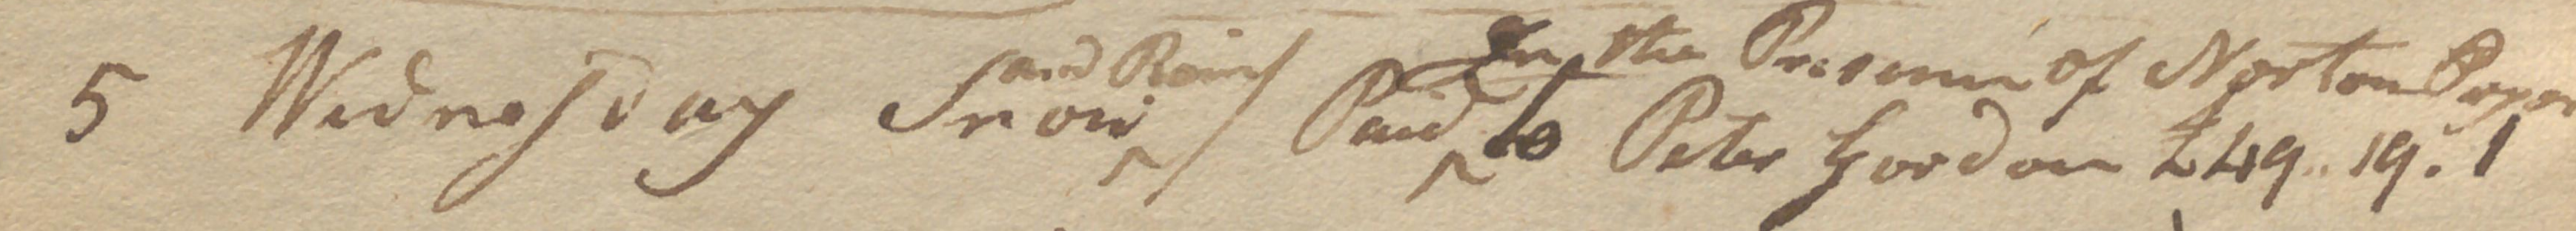5 Wednesday Snow ^ / Paid ^ to Peter Gordon £49.19.1
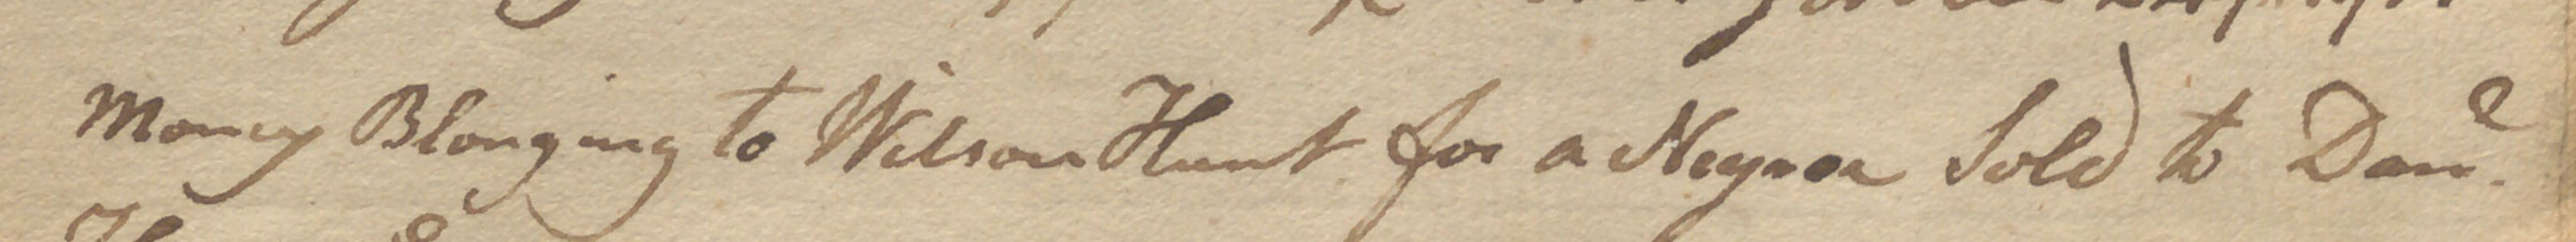Money Blonging to Wilson Hunt for a Neynon sold to Dan^l.
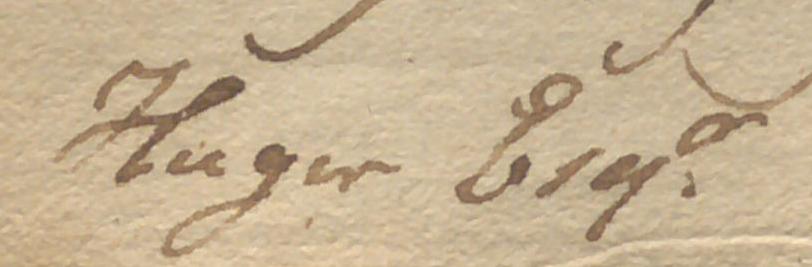Huger Esq^r.
